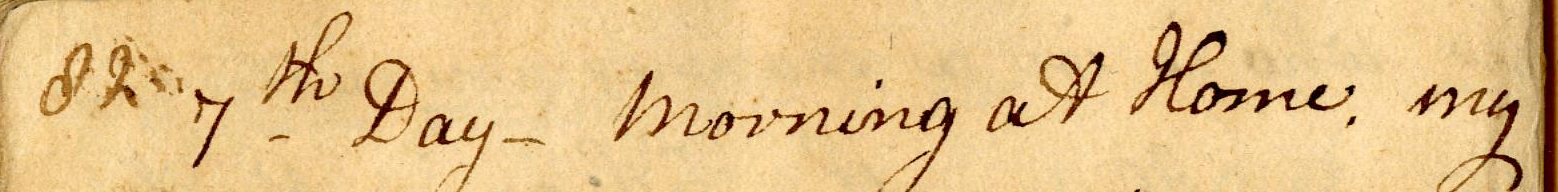7^th Day - Morning at Home, my
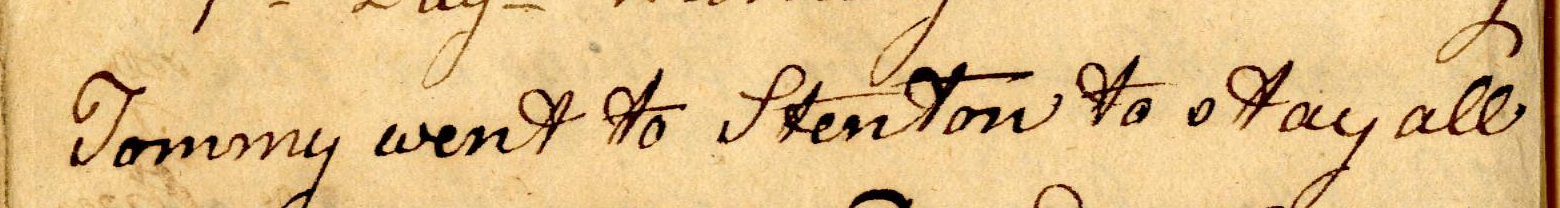Tommy went to Stenton to stay all
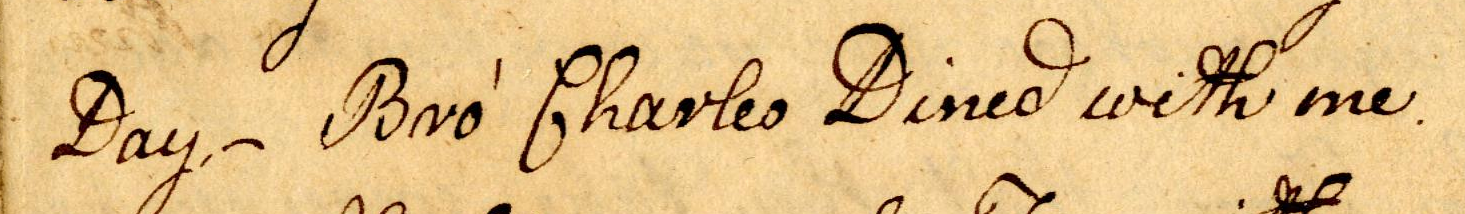Day.- Bro' Charles Dined with me.
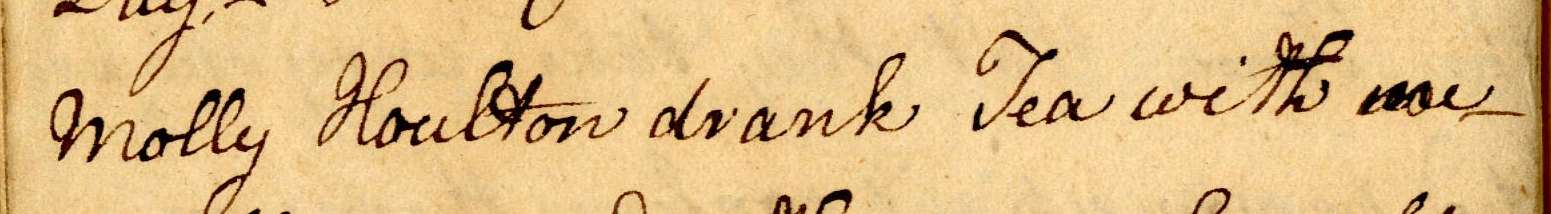Molly Houlton drank Tea with me-
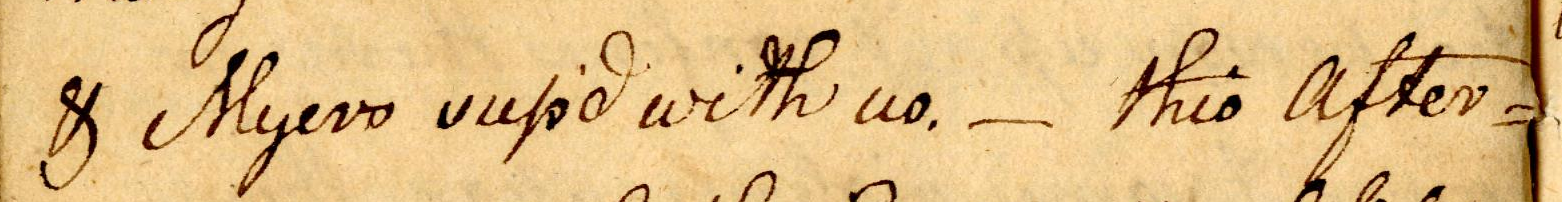& Myers sup'd with us.- this After-
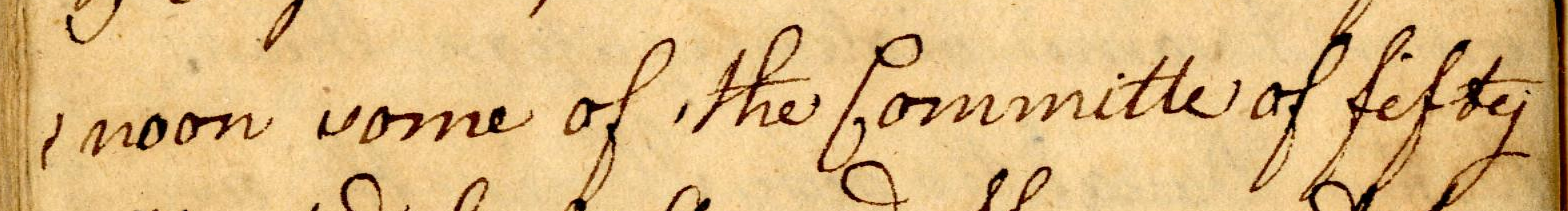-noon some of the Committe of fifty
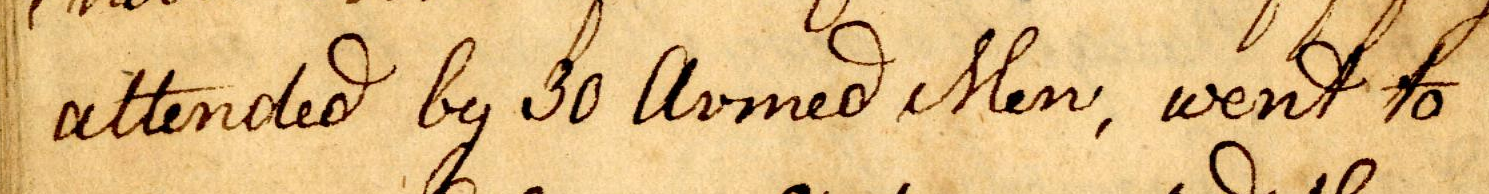attended by 30 Armed Men, went to
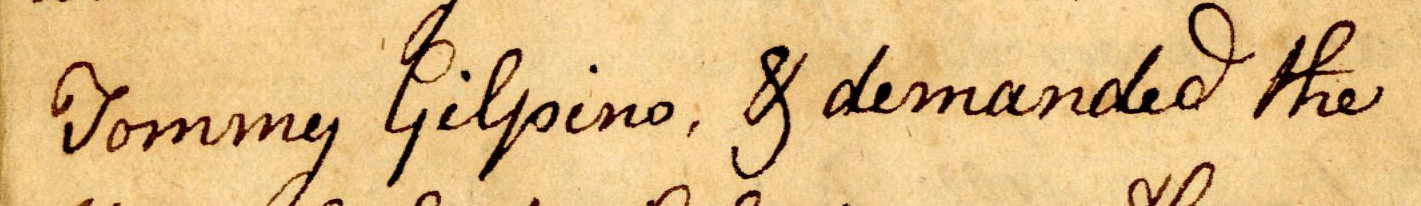Tommy Gilpins, & demanded the
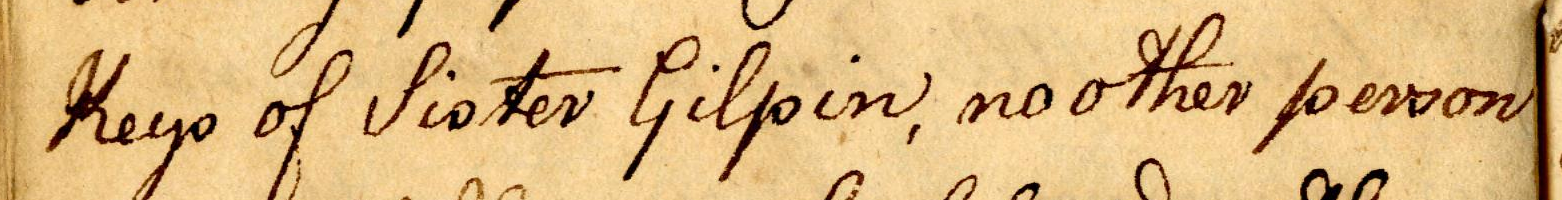Keys of Sister Gilpin, no other person
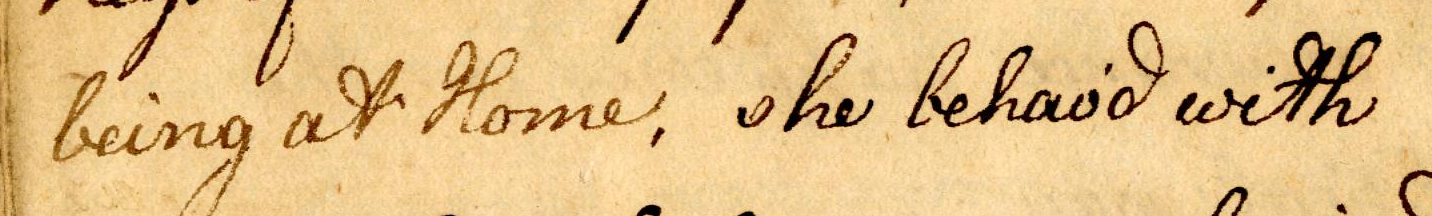being at Home, she behav'd with
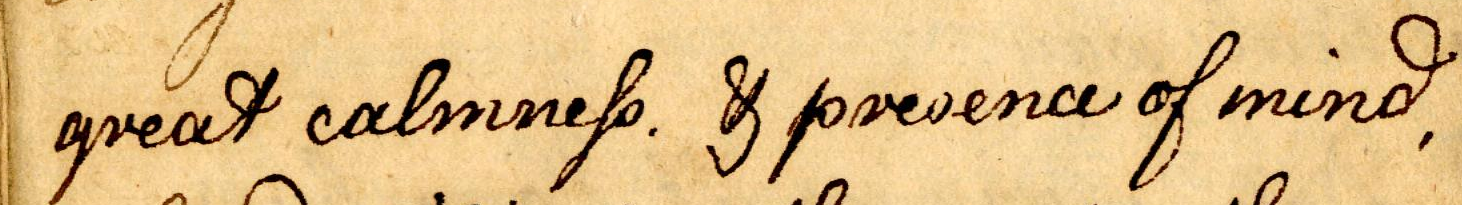great calmness. & presence of mind,
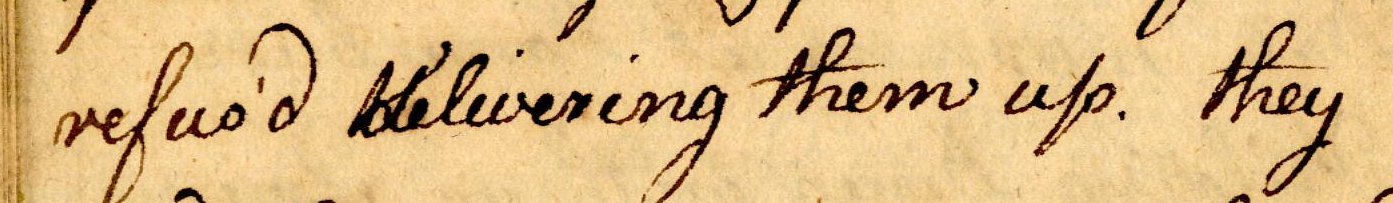refus'd delivering them up. they
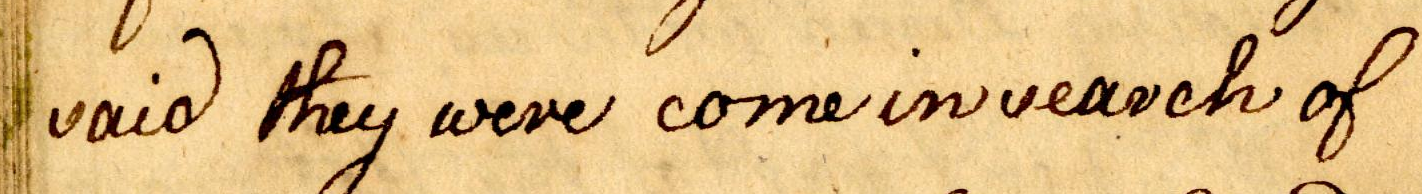said they were come in search of
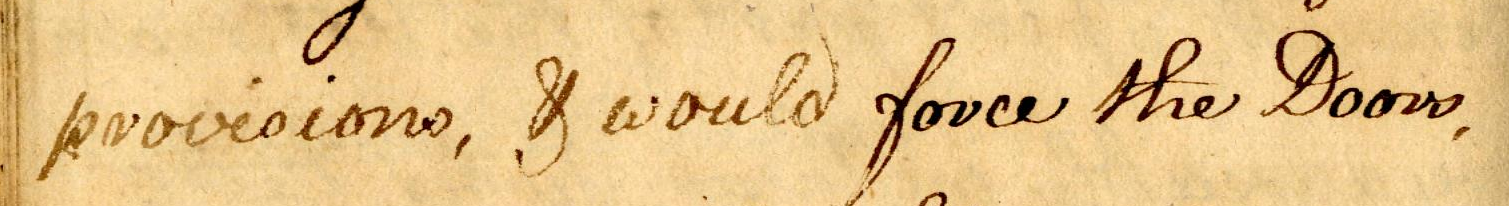provisions, & would force the Doors,
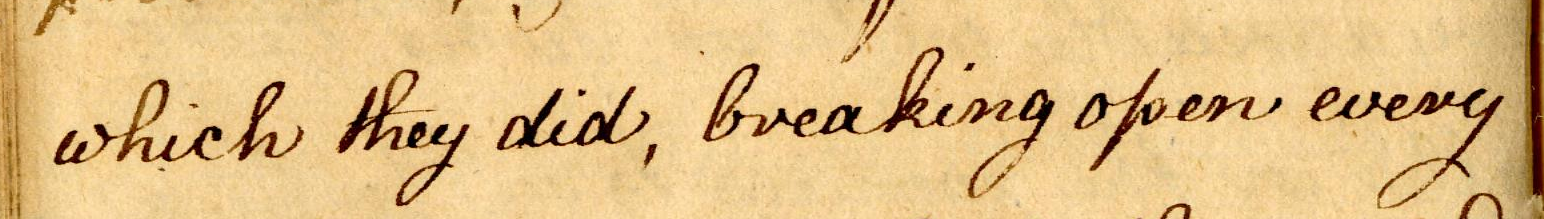which they did, breaking open every
